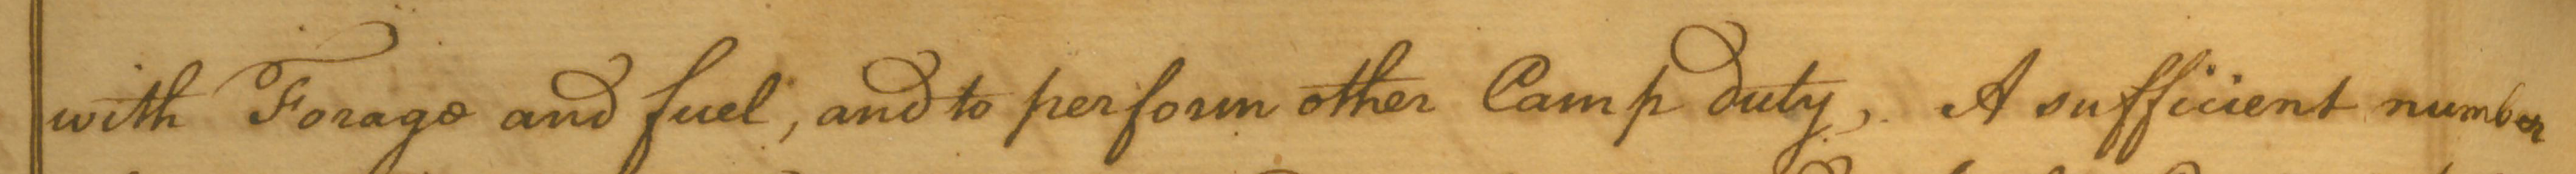with Forage and fuel, and to perform other Camp duty, A sufficient number
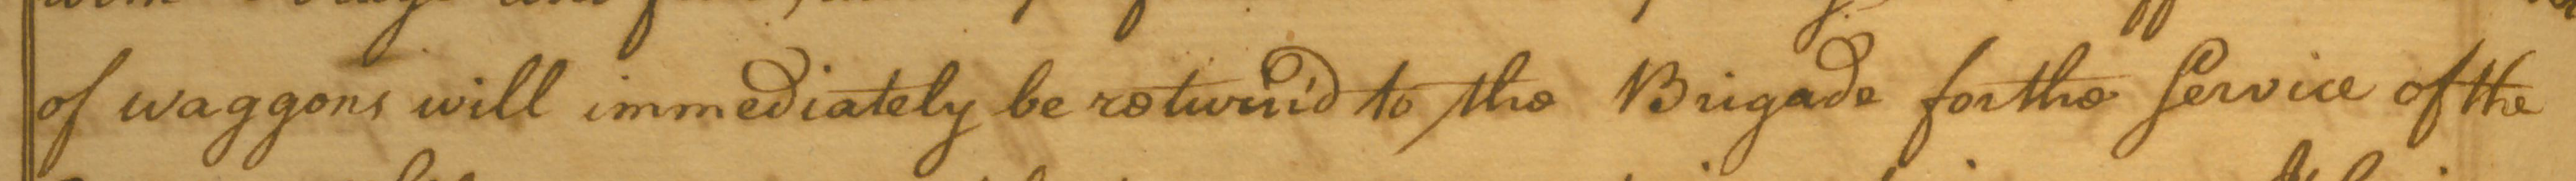of Waggons will immediately be return'd to the Brigade for the service of the
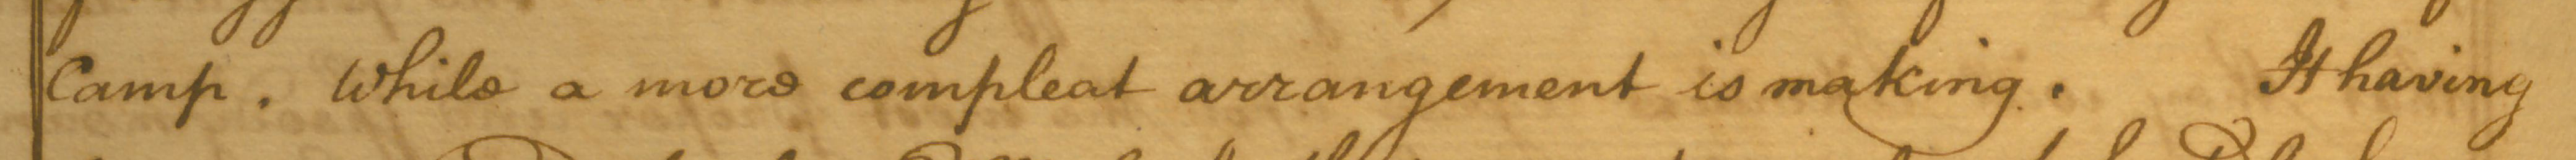Camp. While a more compleat arrangement is making. It having
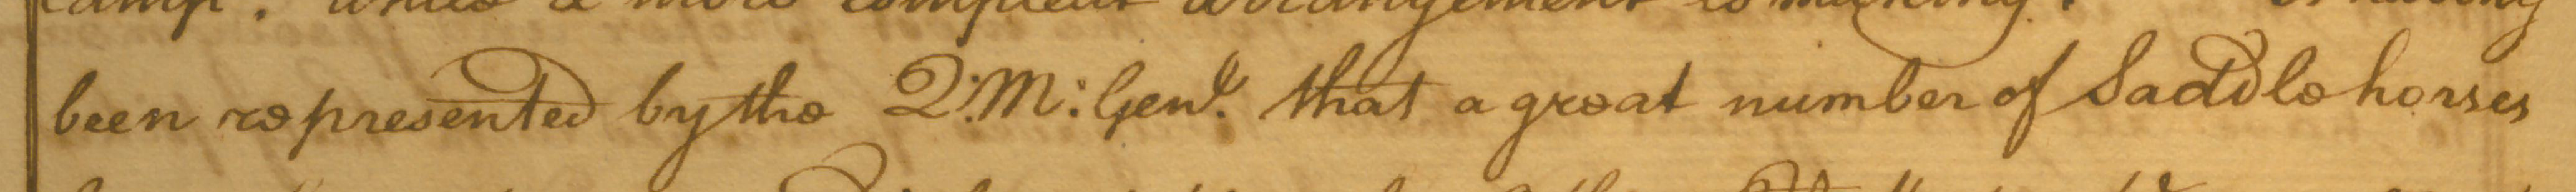been represented by the Q: M: Gen^l. that a great number of Saddle horses
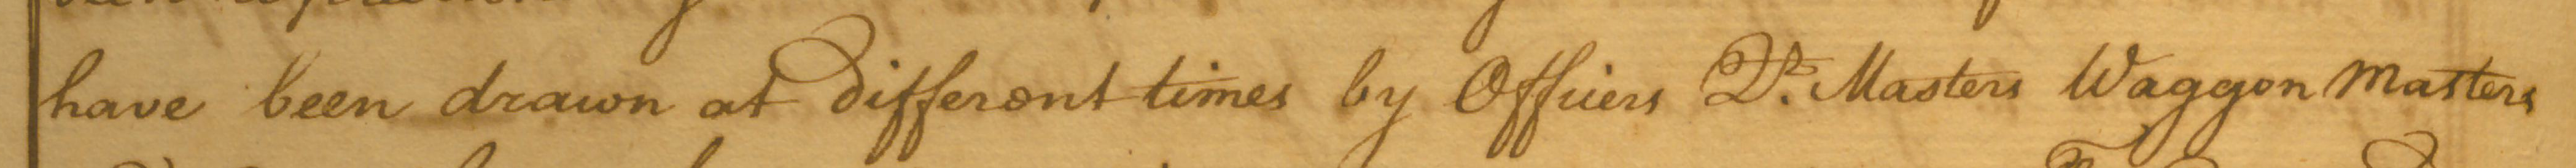have been drawn at different times by Officers Q^r. Masters Waggon Masters
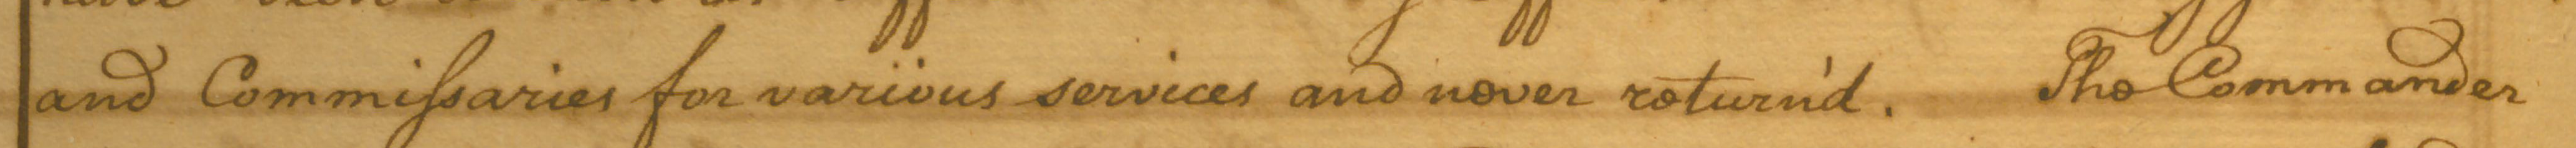and Commissaries for various services and never return'd. The Commander
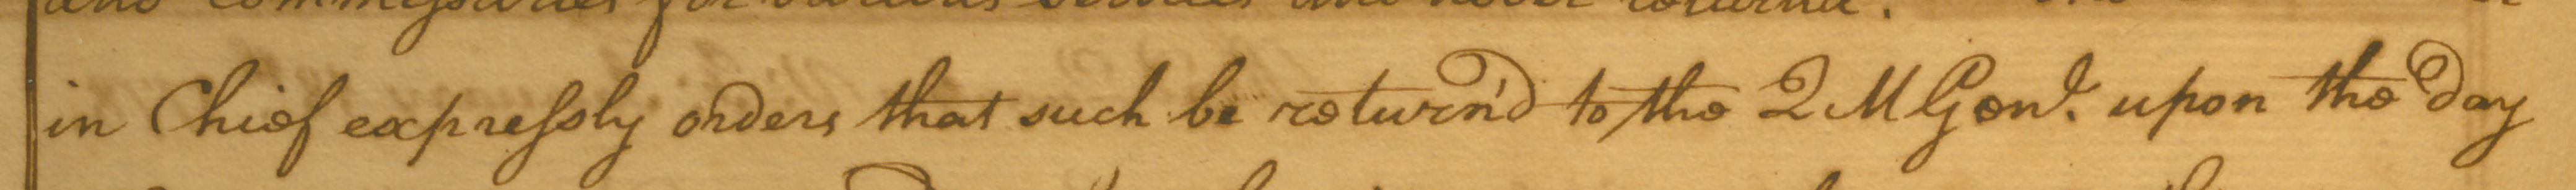in Chief expressly orders that such be return'd to the QMGen^l. upon the day
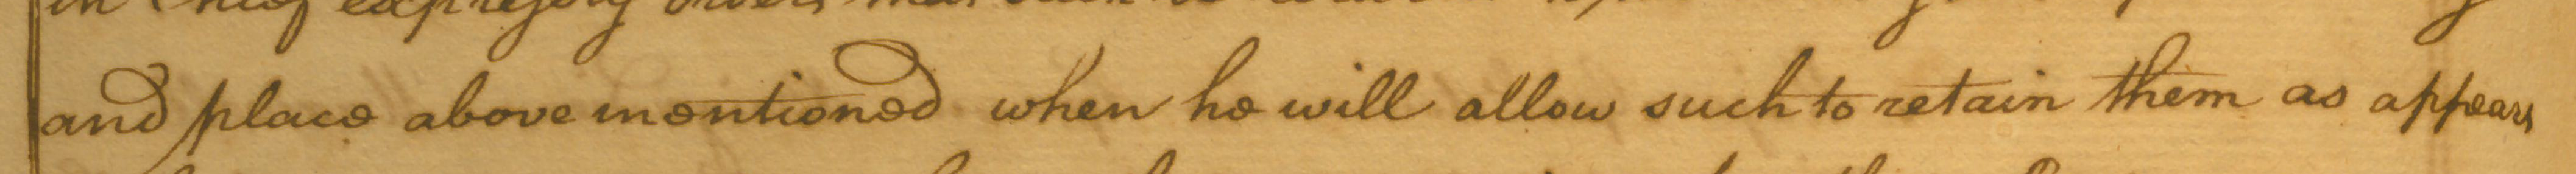and place above mentioned when he will allow such to retain them as appears
